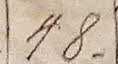48
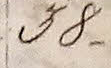38
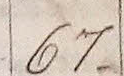67
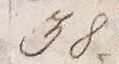38
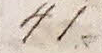41
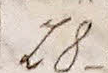28
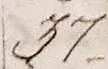37
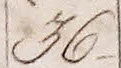36
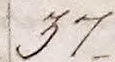37
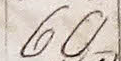60
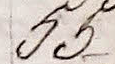55
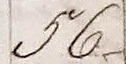56
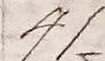41
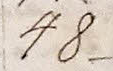48
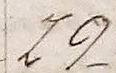29
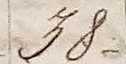38
